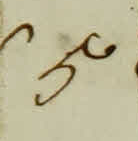5
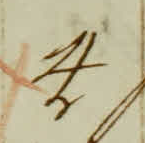4
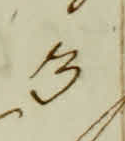3
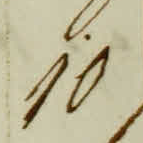10
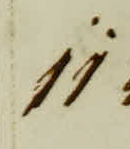11
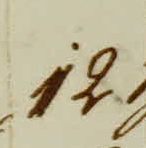12
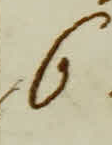6
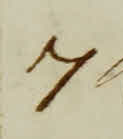7
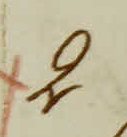2
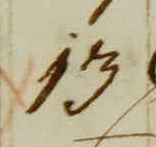13
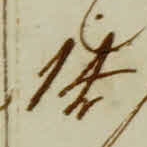14
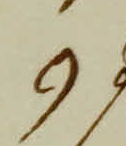9
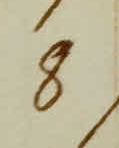8
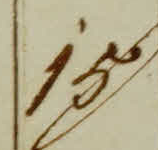15
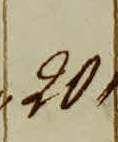20
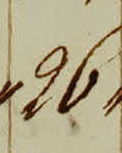26
